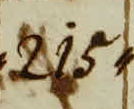215
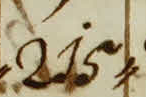215
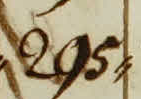295
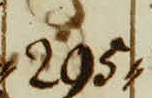295
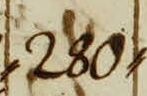280
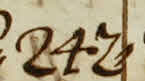242
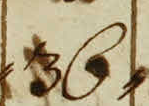36
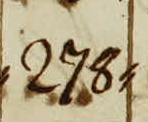278
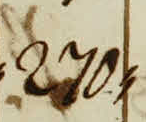270
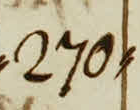270
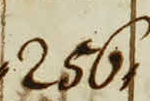256
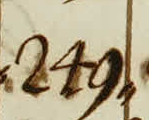249
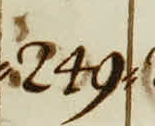249
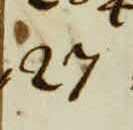27
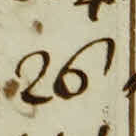26
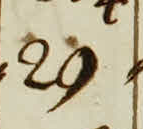29
